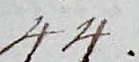44
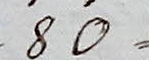80
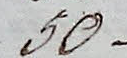50
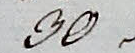30
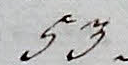53
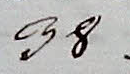38
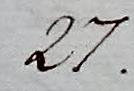27
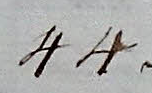44
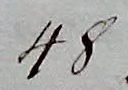48
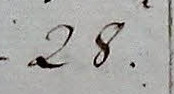28.
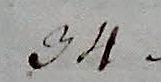34
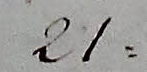21
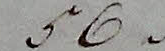56
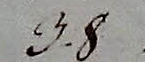38
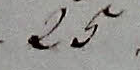25
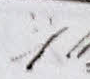1
